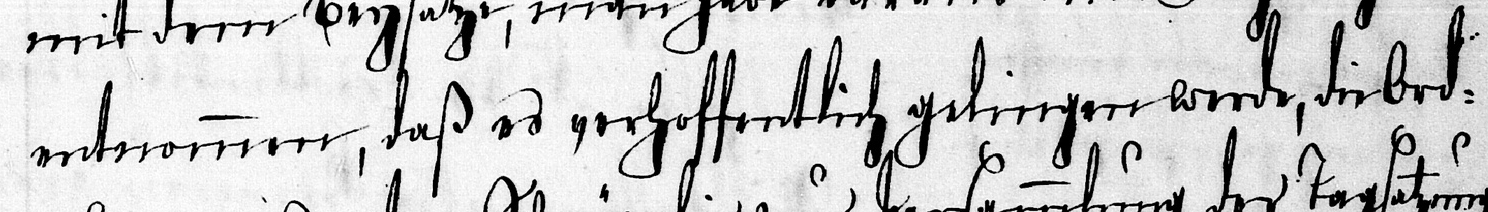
entnommen, daß es verhoffentlich gelingen werde, die Ord¬
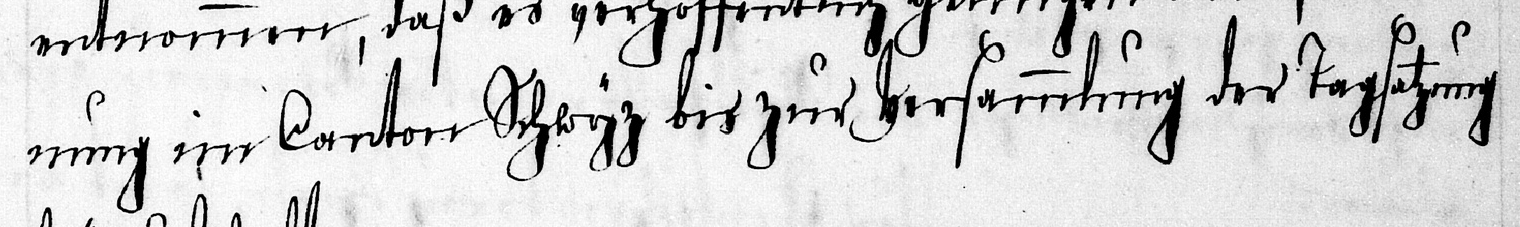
nung im Canton Schwyz bis zur Versammlung der Tagsatzung
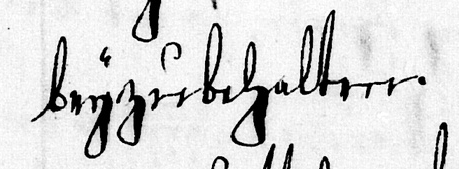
beyzubehalten.
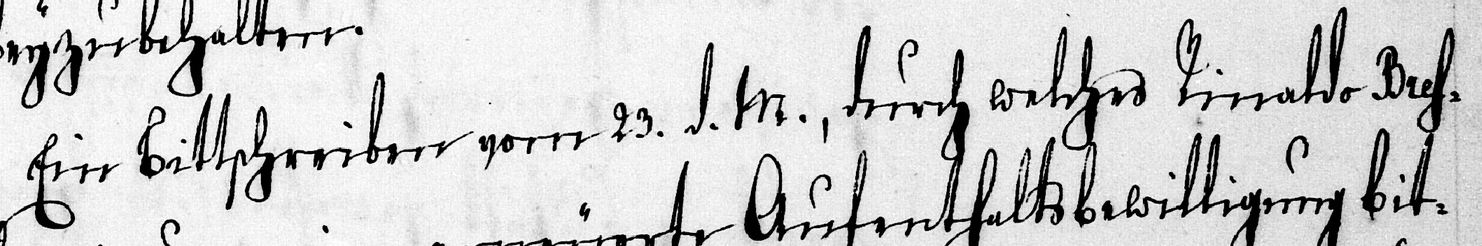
Ein Bittschreiben vom 23. d. M., durch welches Rinaldo Bres¬
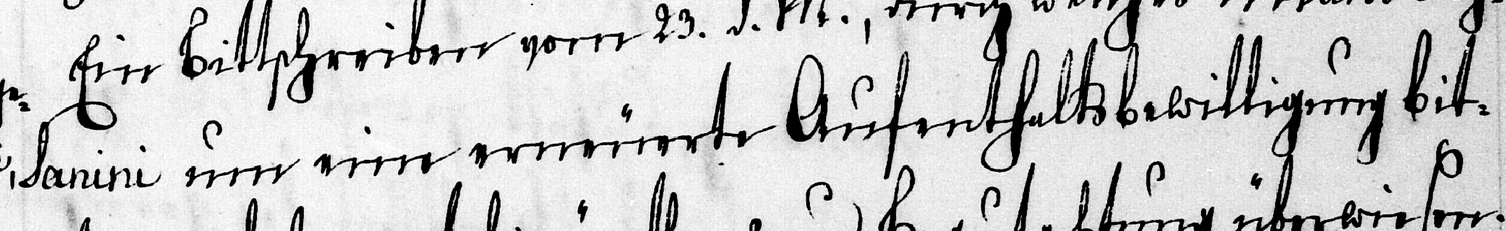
sanini um eine erneuerte Aufenthaltsbewilligung bit¬
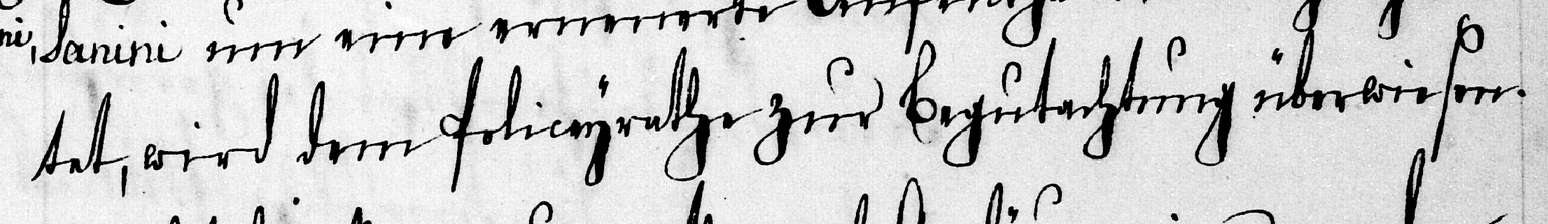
tet, wird dem Policeyrathe zur Begutachtung überwiesen.
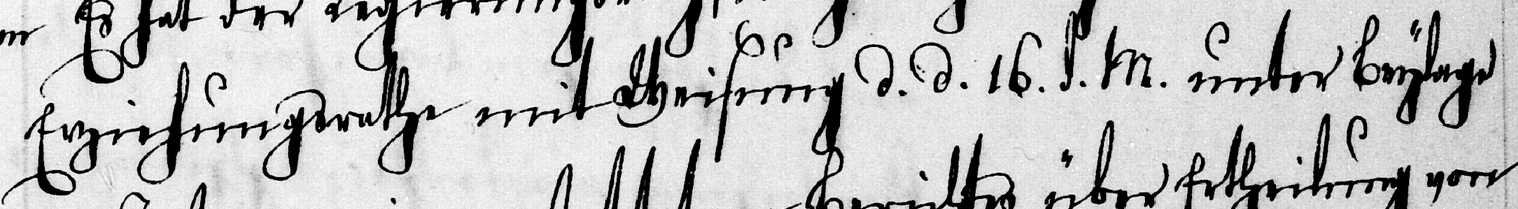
Erziehungsrathe mit Weisung d. d. 16. d. M. unter Beylage
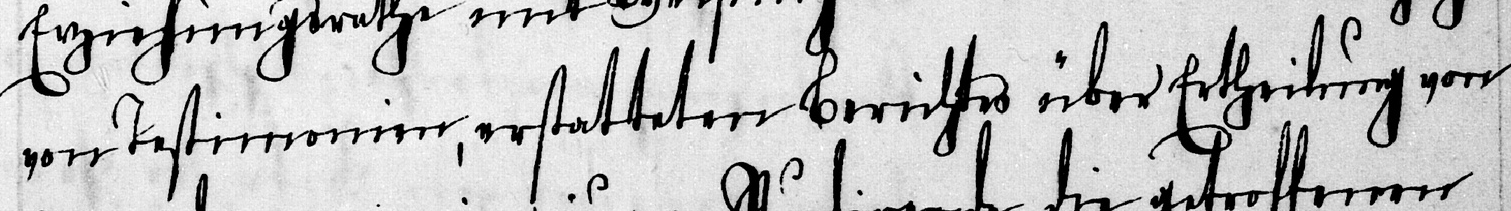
von Testimonien, erstatteten Berichtes über Ertheilung von
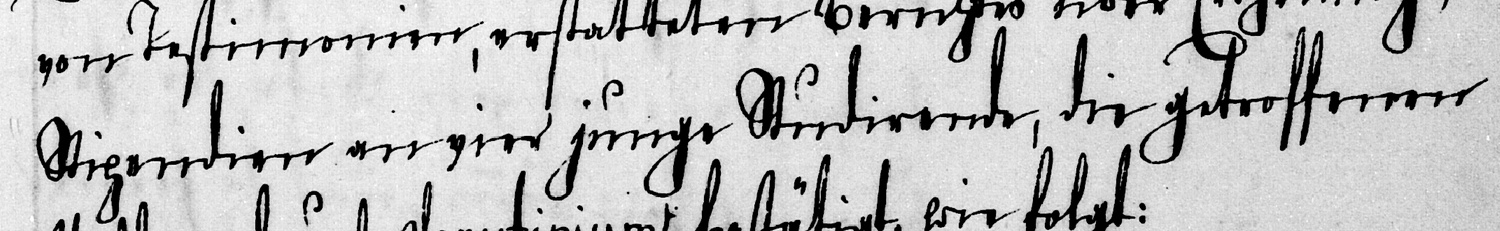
Stipendien an vier junge Studirende, die getroffenen
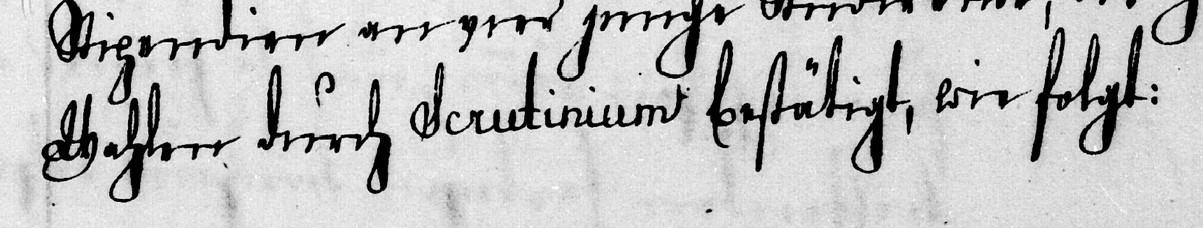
Wahlen durch Scrutinium bestätigt, wie folgt:
